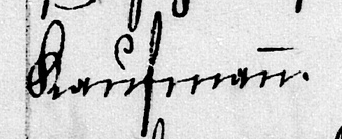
Kaufmann.
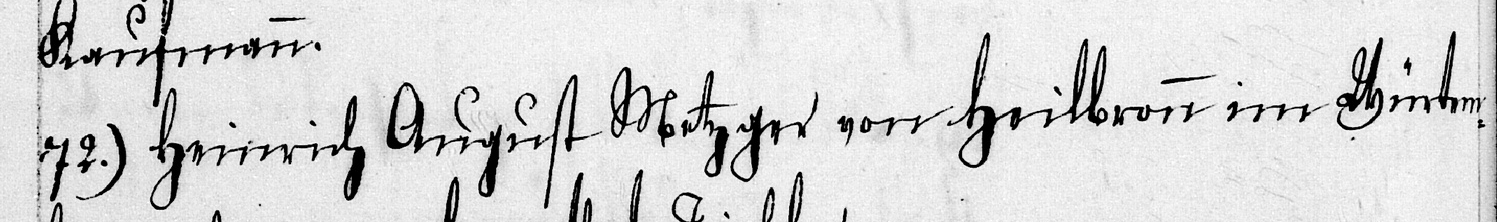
72.) Heinrich August Metzger von Heilbronn im Würte¬
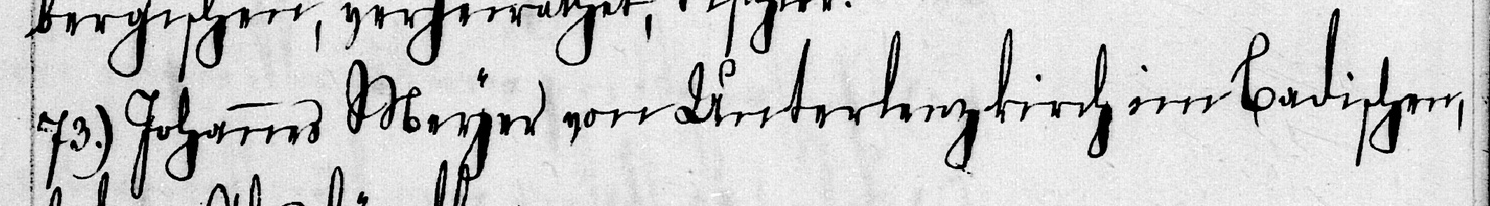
73.) Johannes Meyer von Unterlenzkirch im Badischen,
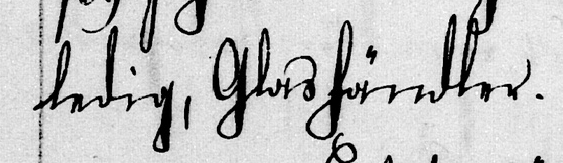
ledig, Glashändler.
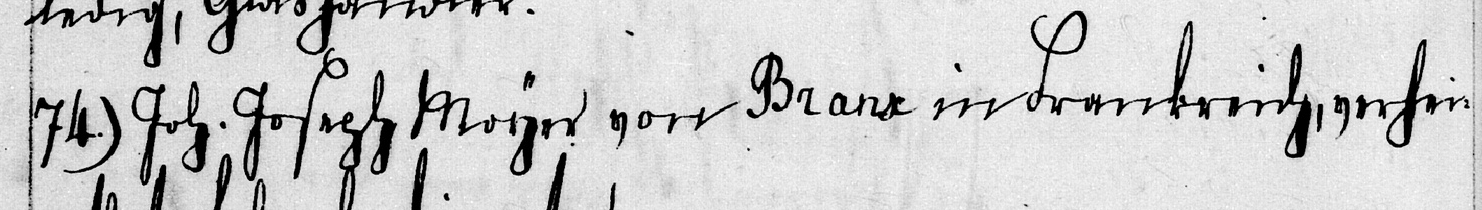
74.) Joh. Joseph Moyer von Branx in Frankreich, verhei¬
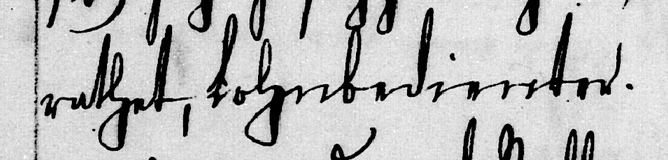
rathet, Lohnbedienter.
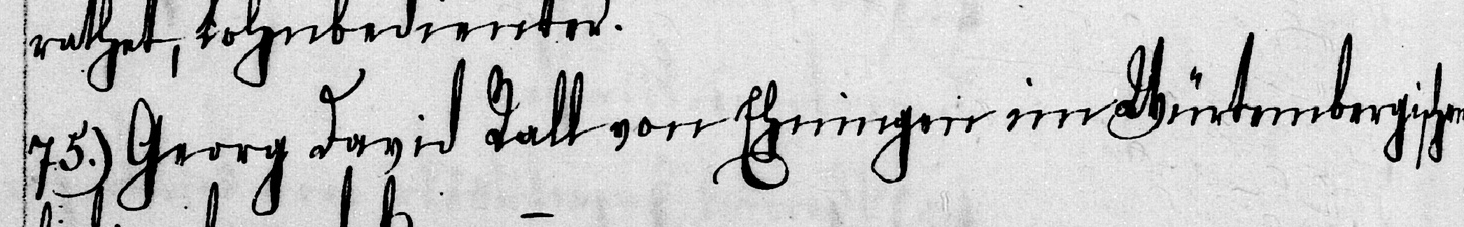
75.) Georg David Rall von Ehningen im Würtembergis¬
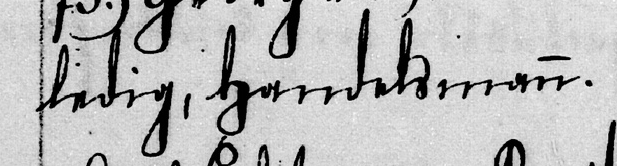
ledig, Handelsmann.
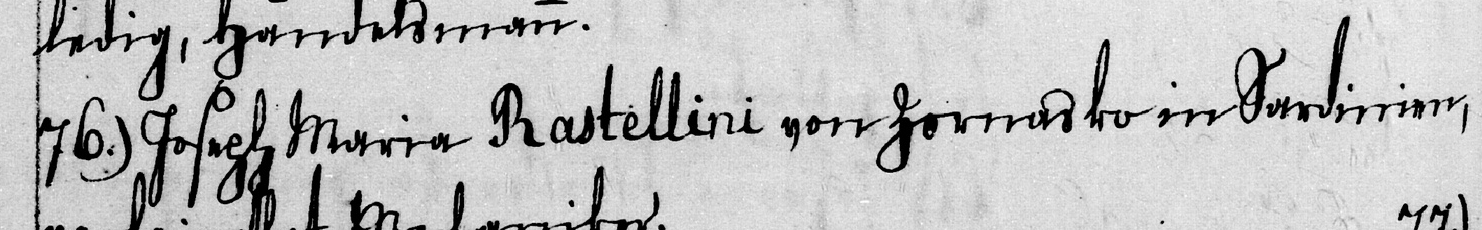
76.) Joseph Maria Rastellini von Zornasko in Sardinien,
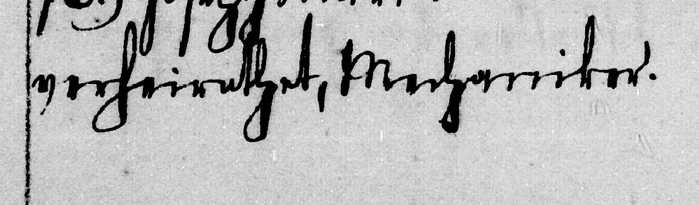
verheirathet, Mechaniker.
